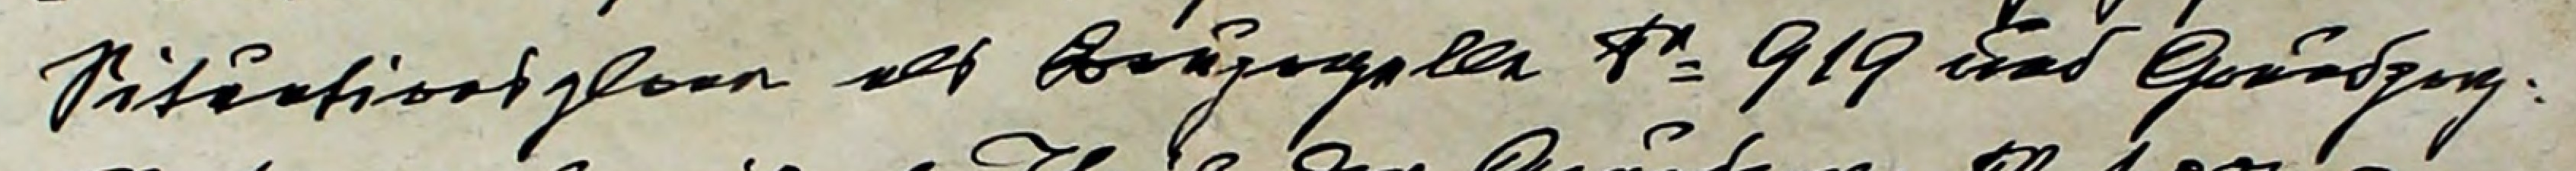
Situationsplane als Bauparzelle Nn 919 und Grundparz:
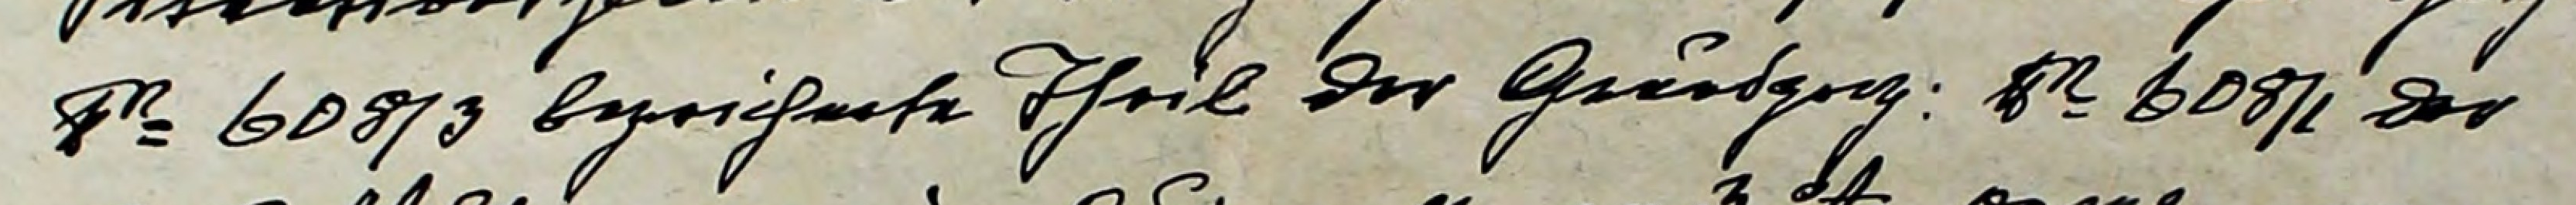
Nn 608/3 bezeichnete Theil der Grundparz: Nn 608/1 der
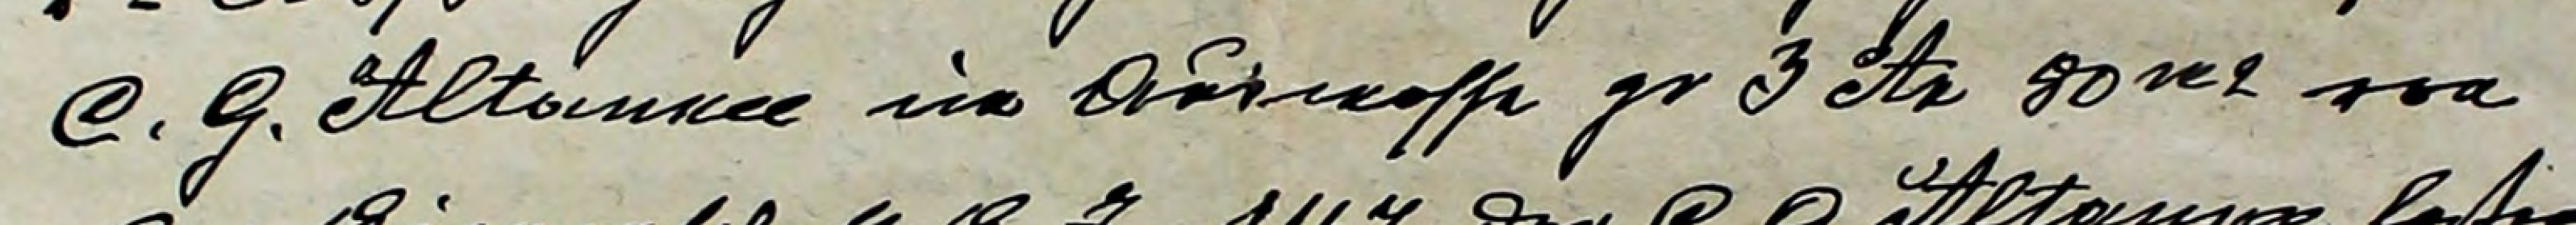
C.G. Altaussee im Ausmesse pr 3 An 80 m2 von
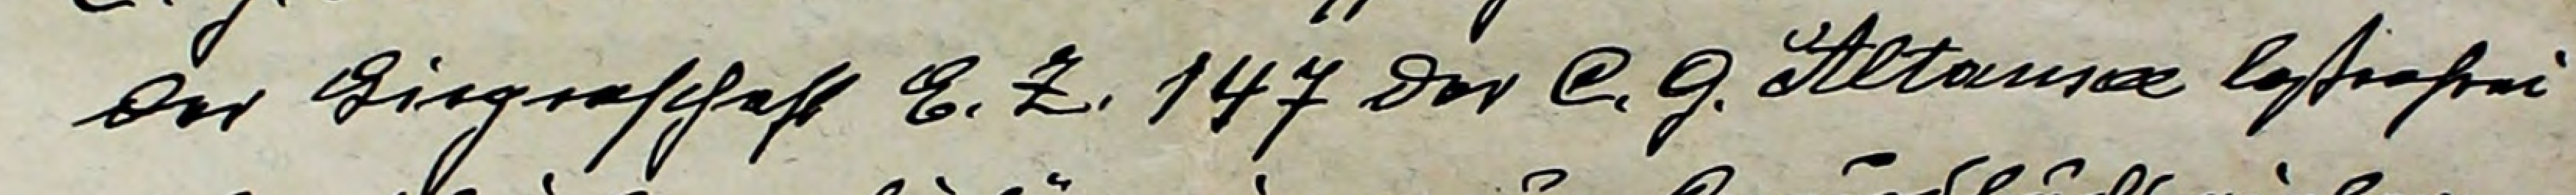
der Liegenschaft E.Z. 147 der C.G. Altaussee lastenfrei
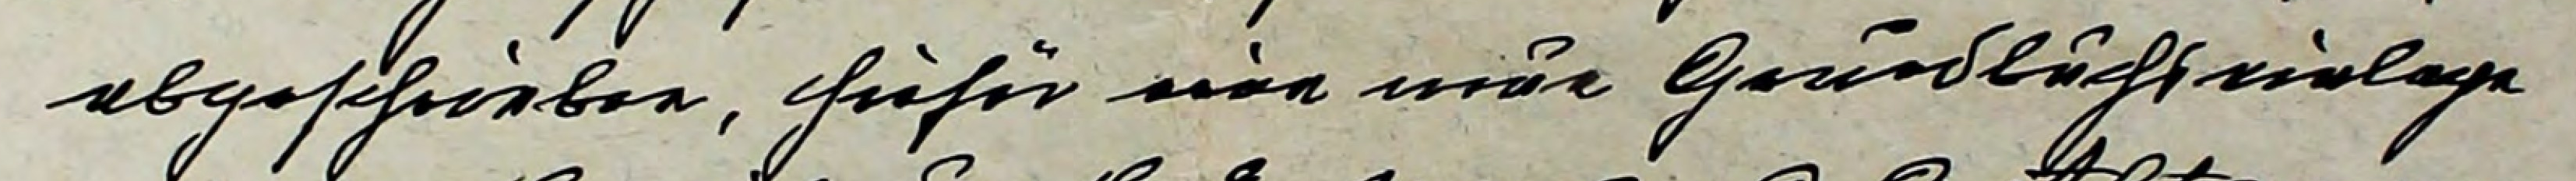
abgeschrieben, hiefür eine neun Grundbuchs einlege
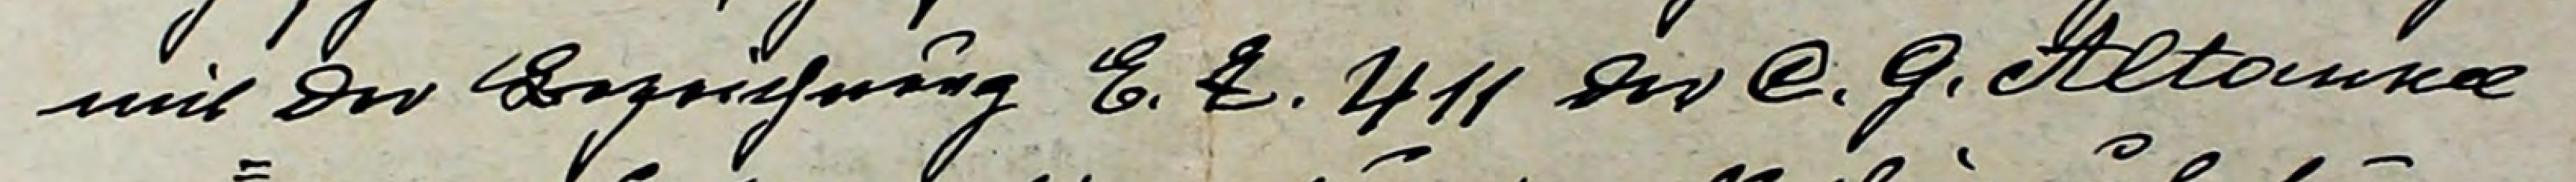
mit der Bezeichnung E.Z. 411 der C.G. Altaussee
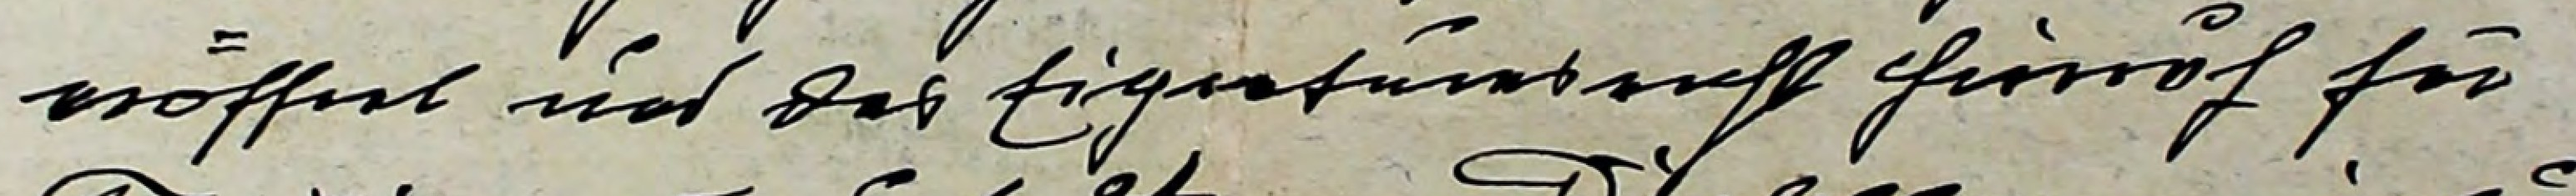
eröffnet und das Eigentumsrecht hie???uh sei
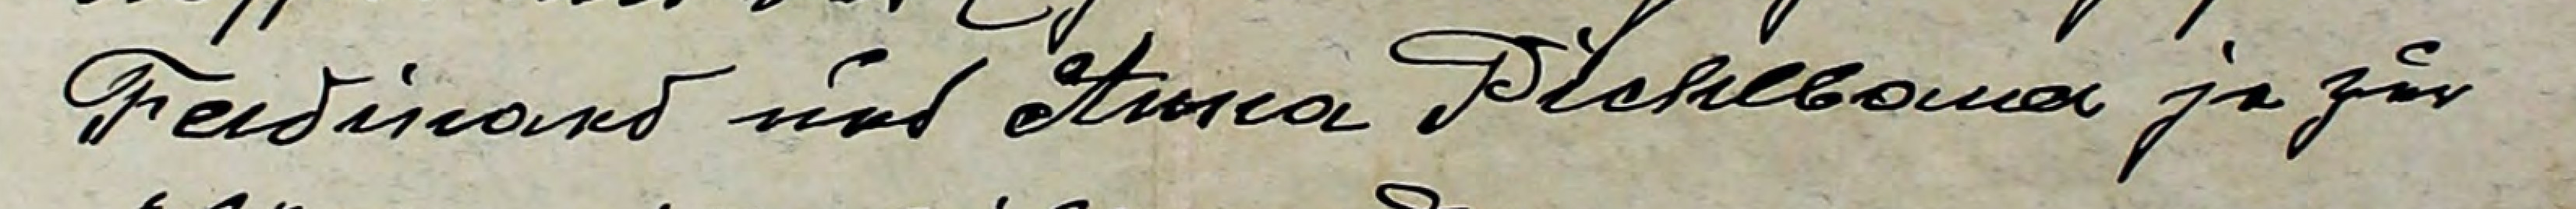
Ferdinand und Aussa Pichlbauer je zur
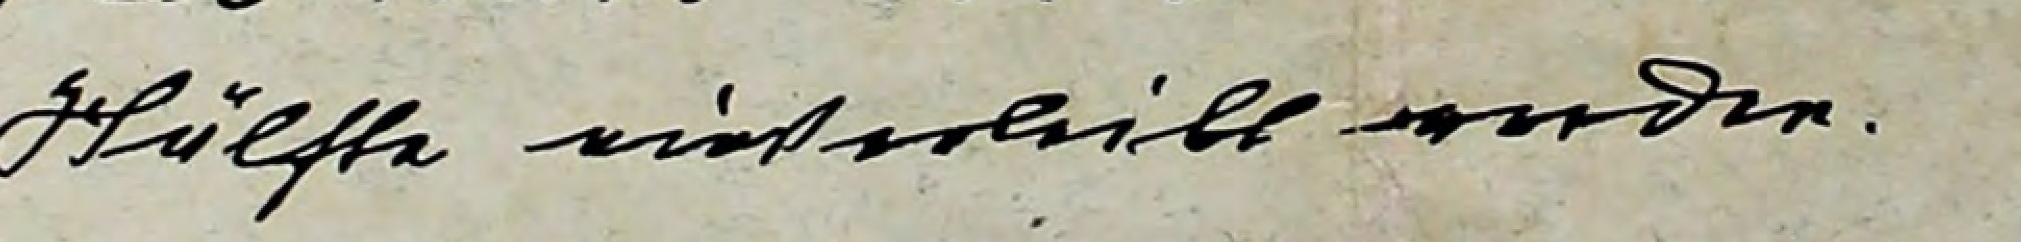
Hälfte einverleibt werden.
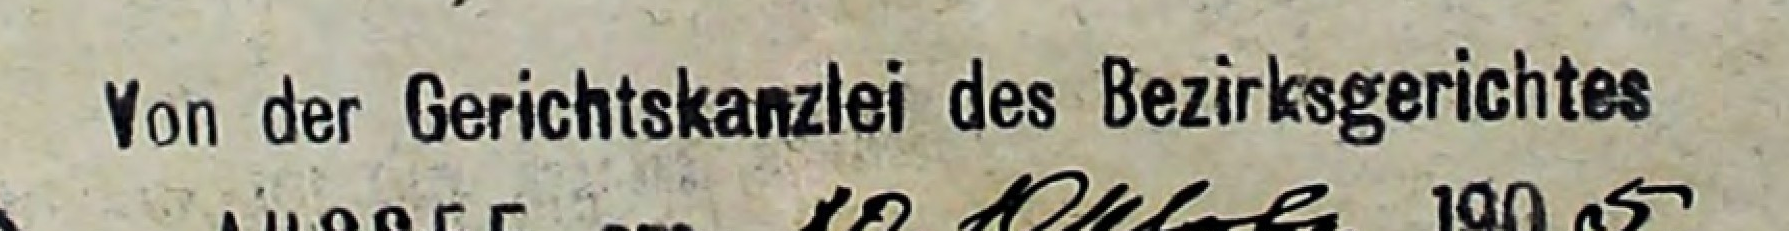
Von der Gerichtskanzlei des Bezirksgerichtes
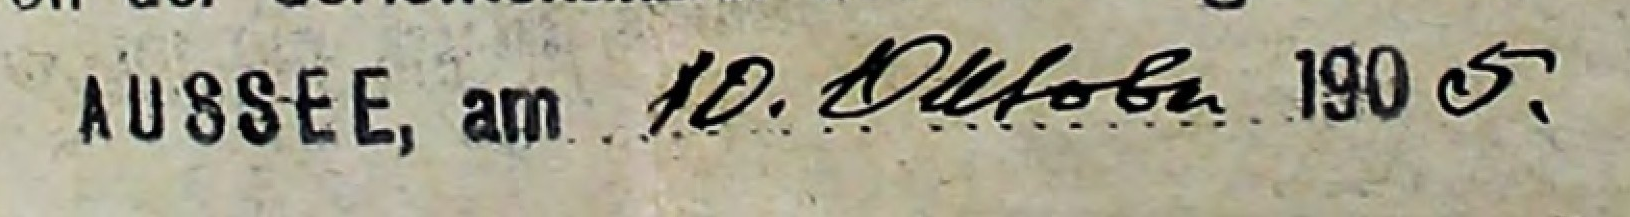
AUSSEE, am 10. Oktober 1905.
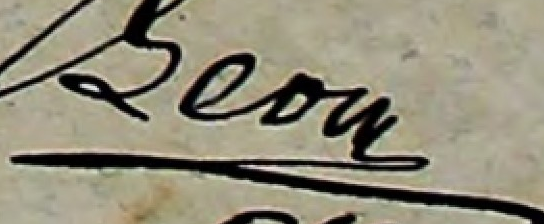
Leon
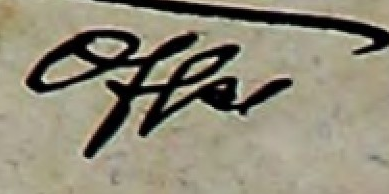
Of???
